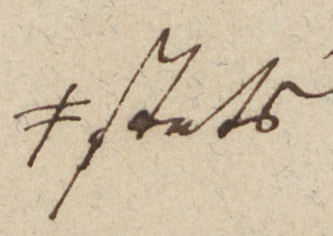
wichtigen
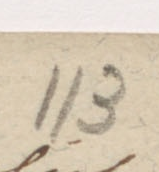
101.
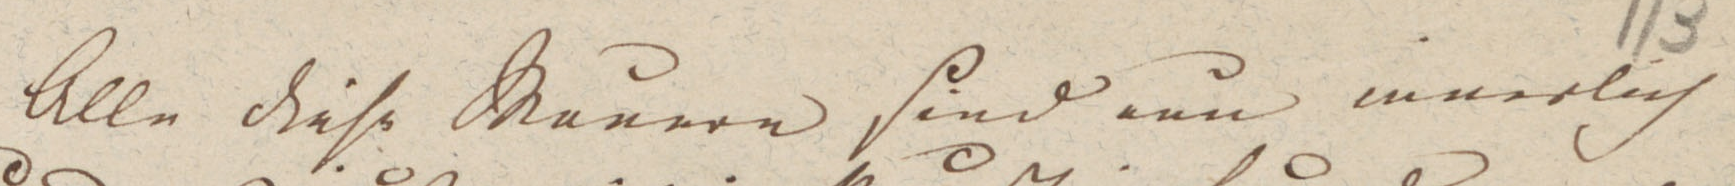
Alle diese Mauern sind nun innerlich
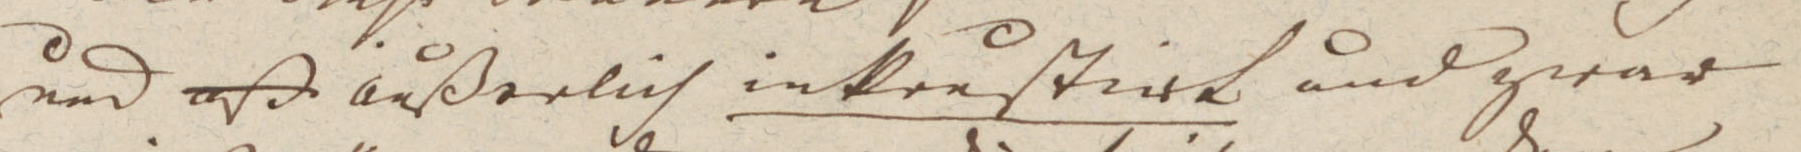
und ass äusserlich inkrustirt und zwar
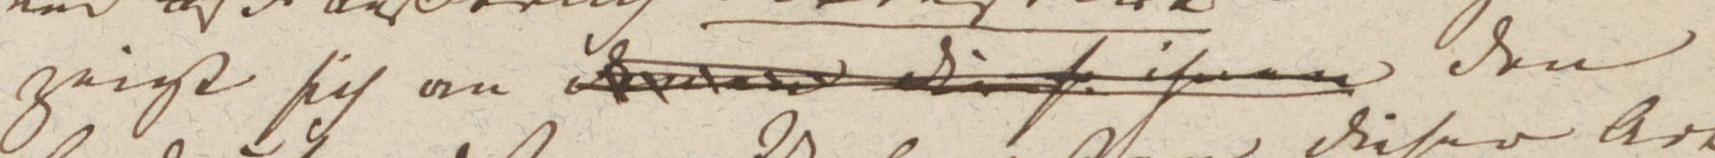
zeigt sich an denen die so ihnen den
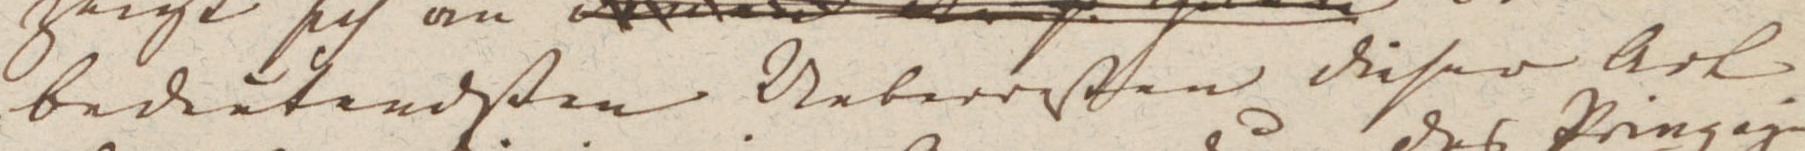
bedeutendsten Ueberresten dieser Art
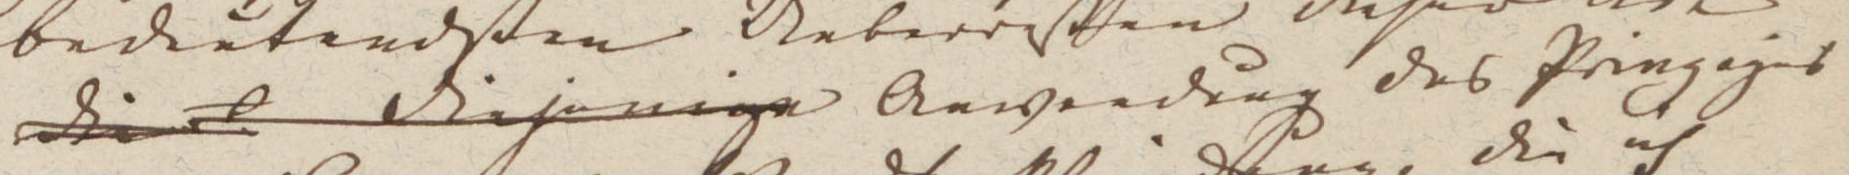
die diejenige Anwendung des Prinzipes
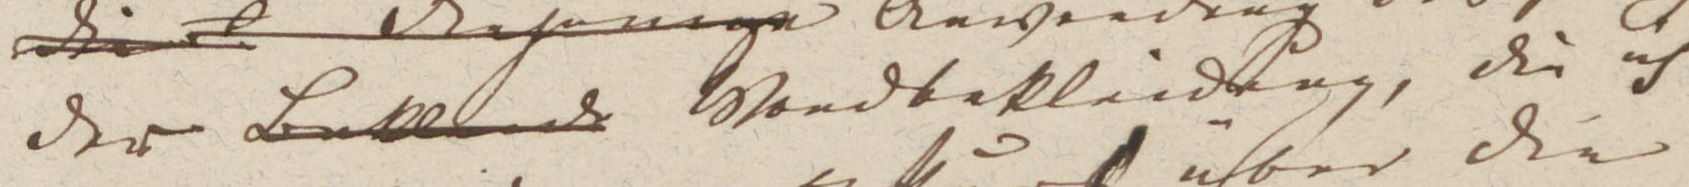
der Bekleid Wandbekleidung, die ich
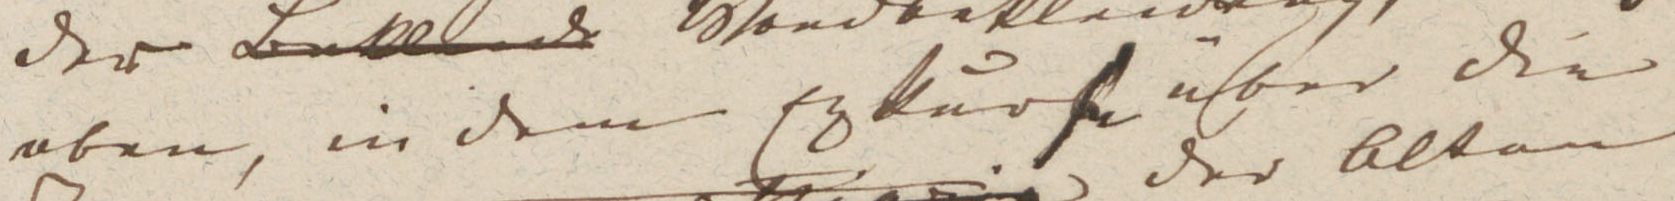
oben, in dem Exkursse über die
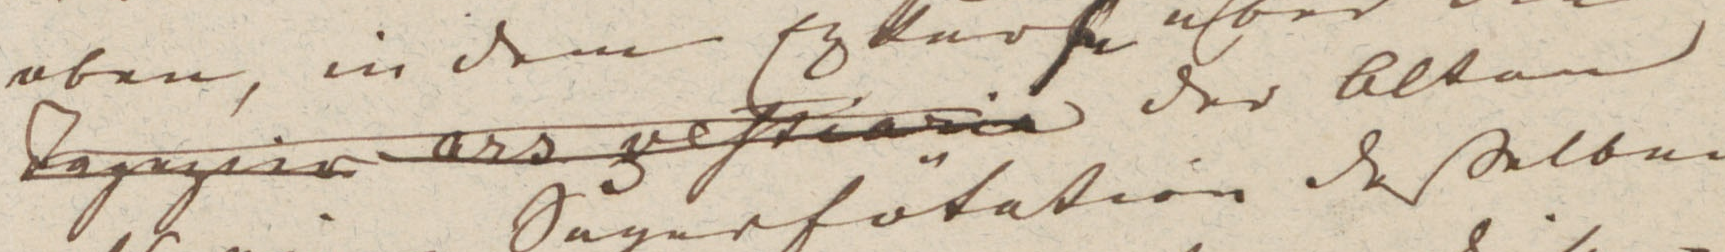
Tapezier ars vestiaria der Alten
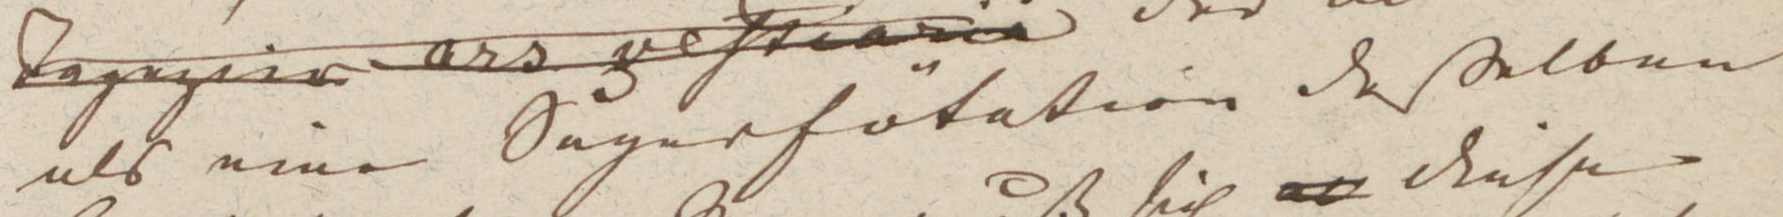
als eine Superfötation desselben
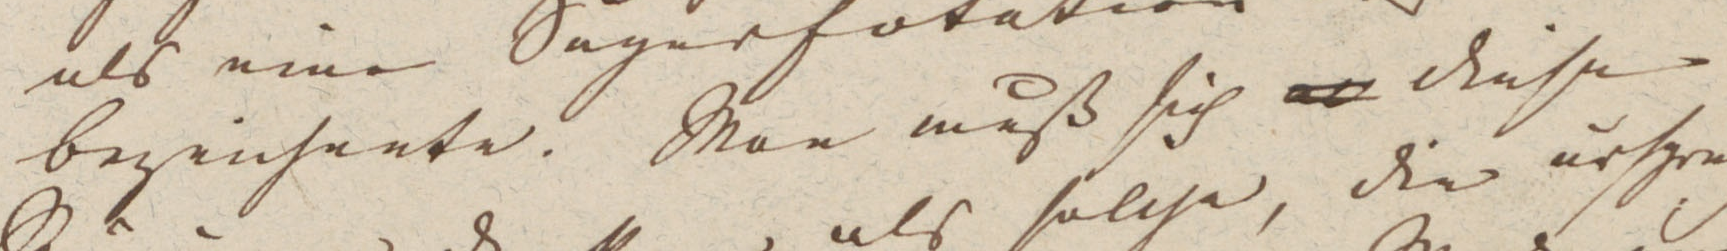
bezeichnete. Man muss sich a diese
